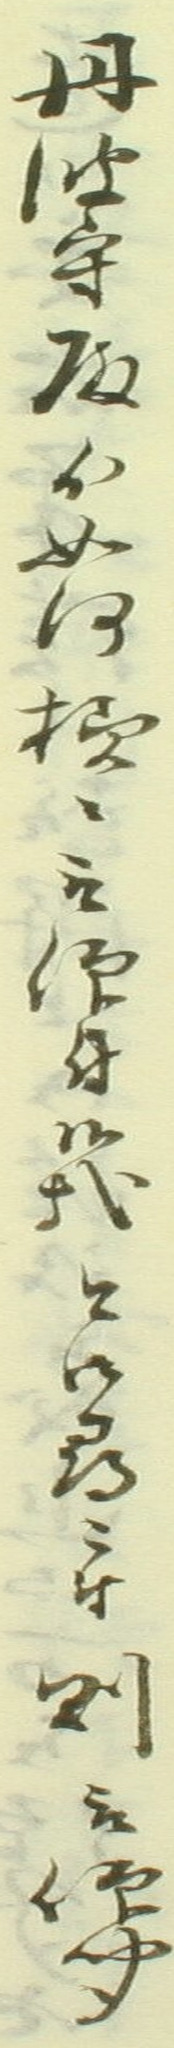丹波守殿被如何様に被仰付候哉と尋に付則被仰聞
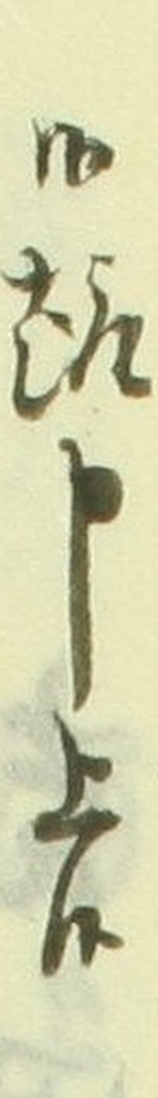候趣申上候
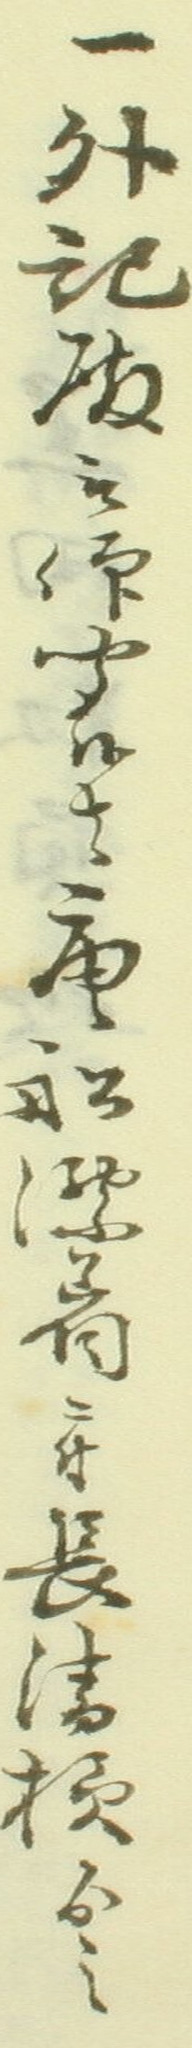一外記殿被仰聞候は唐船漂着に付長清様ゟ之
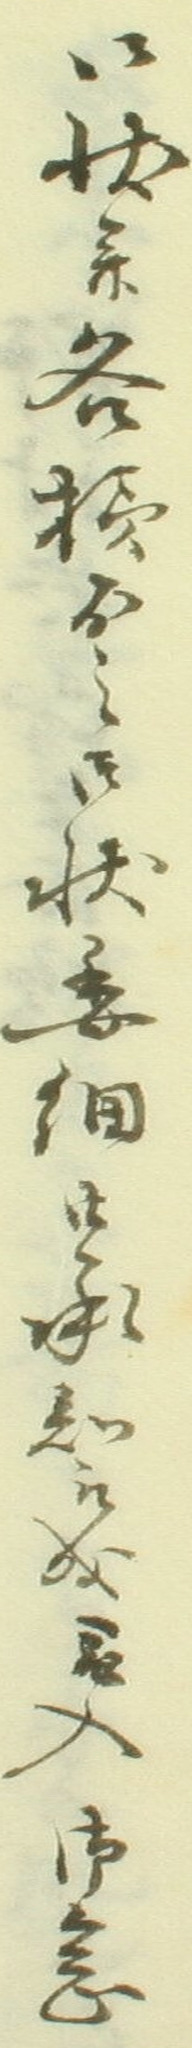御状并各様ゟ之御状委細御承知被成被入御念
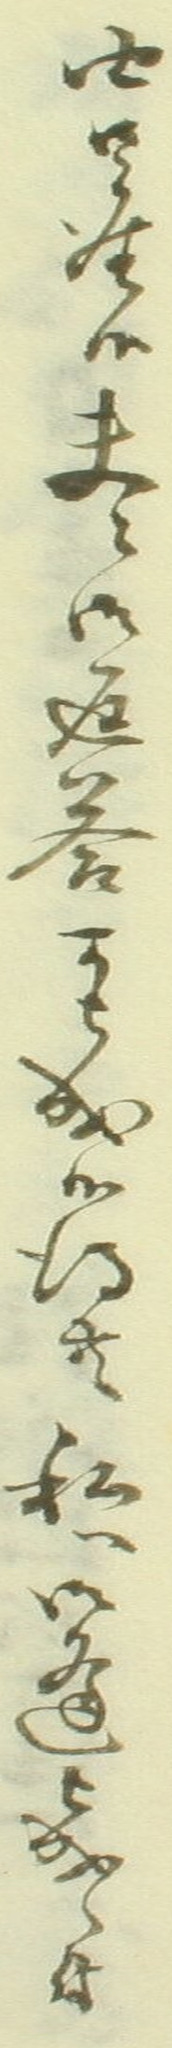由御座候夫々御返答可被成候得共私へ御逢被成候付
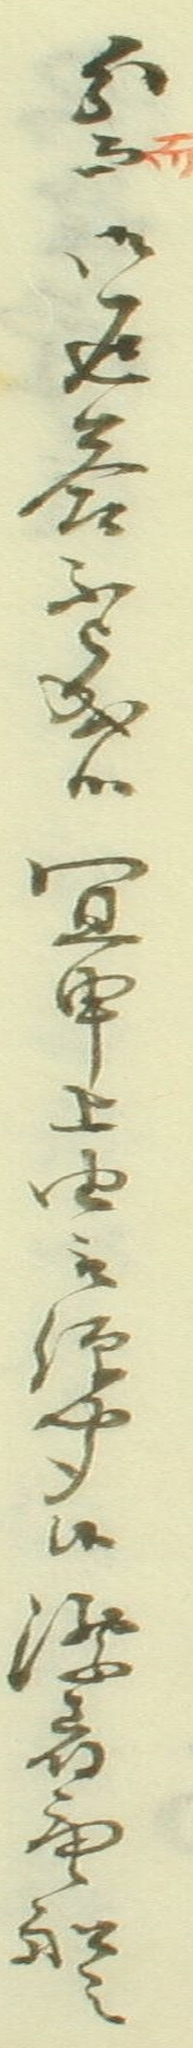分而御返答不被成候宜申上由被仰聞候漂着唐船之
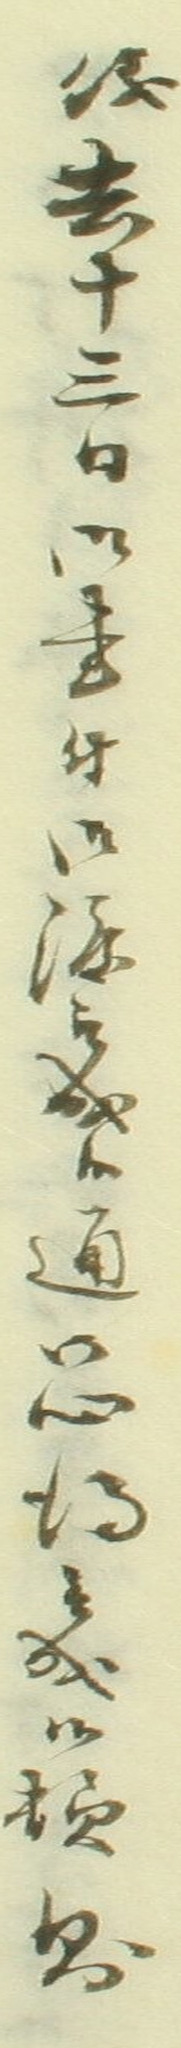儀去十三日御書付御渡被成候通御心得被成候様則
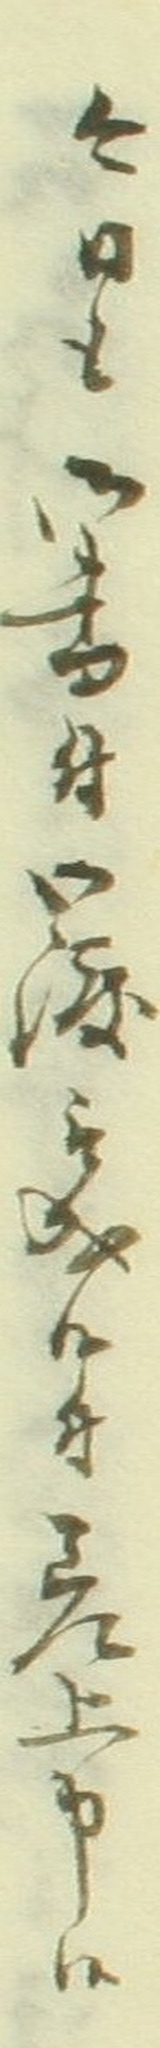今日も御書付御渡被成候付差上申候
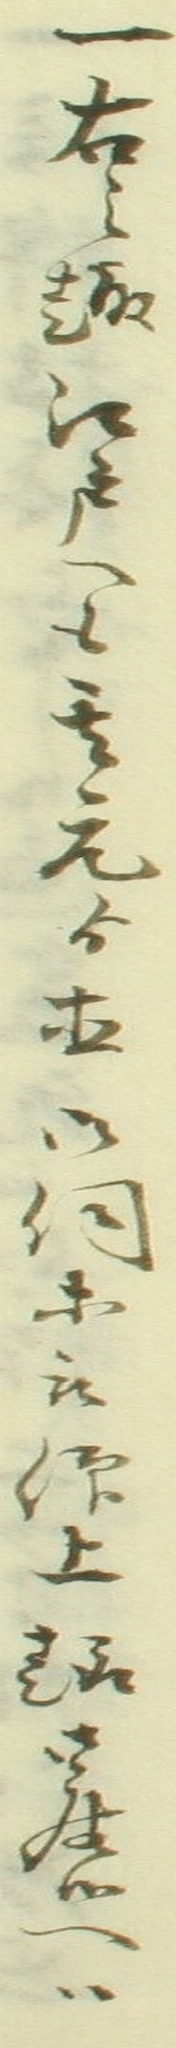一右之趣江戸へも其元ゟ直御伺等被仰上趣御座候へは
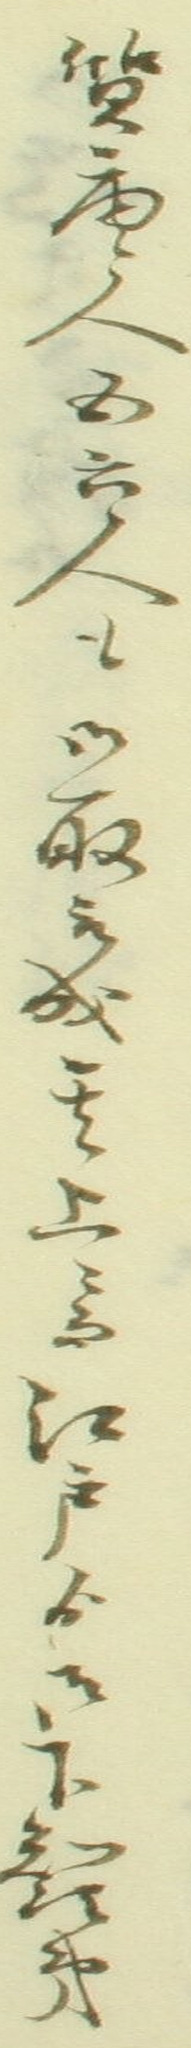質唐人五六人も御取被成其上に而江戸ゟ御下知次第
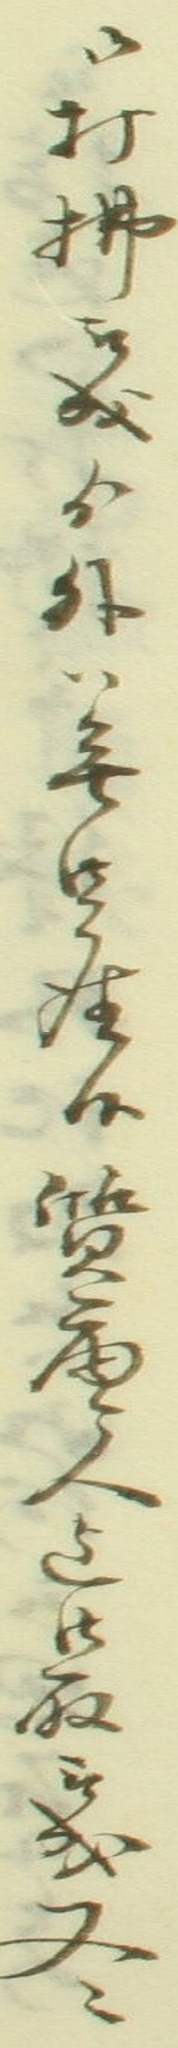御打払被成ゟ外は無御座候質唐人迄御取被成又々

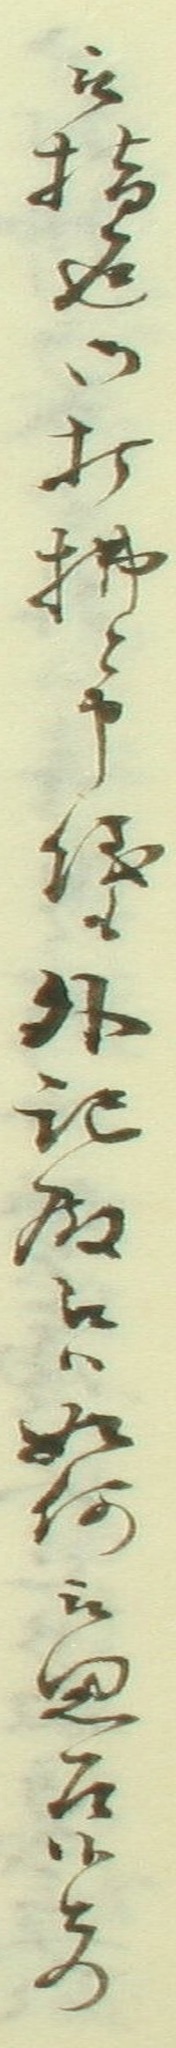被指返御打払と申儀も外記殿えは如何被思召候との
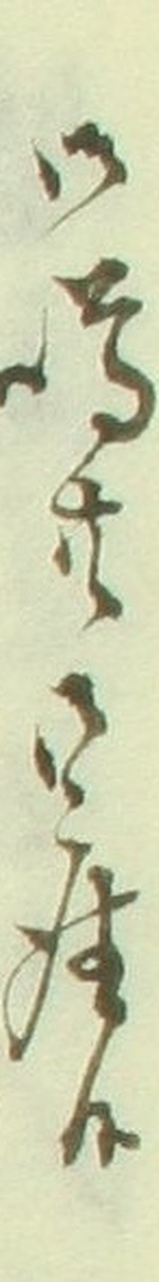御噂共御座候
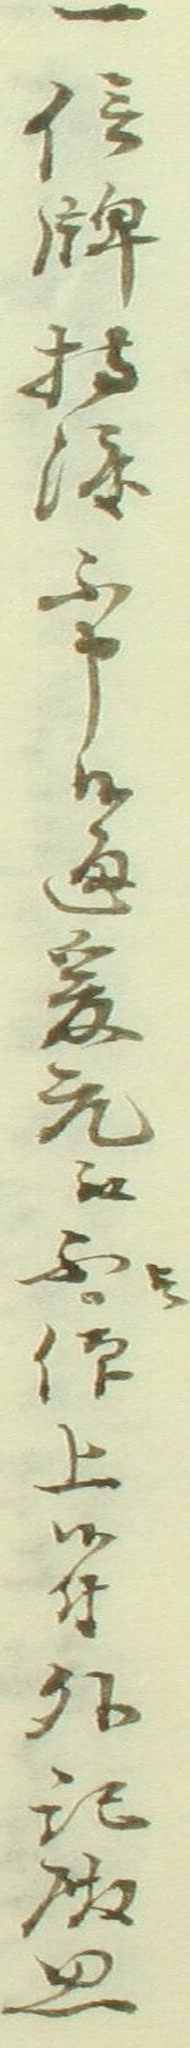一信牌持渡不申候通爰元え不◦仰上候付外記殿思
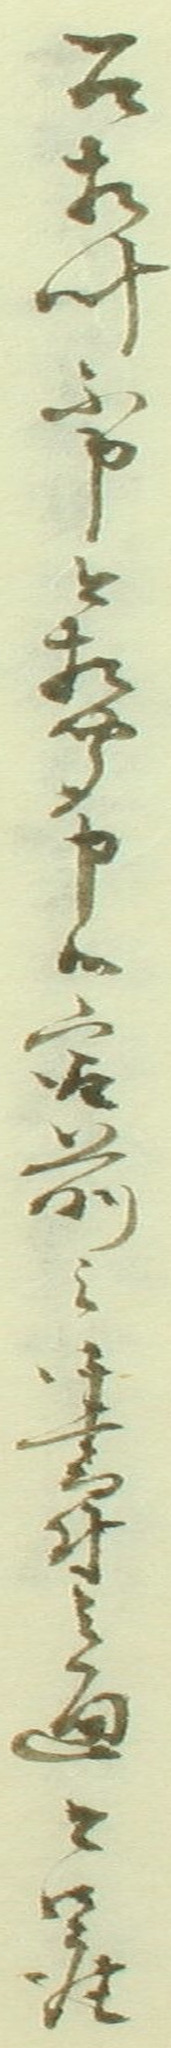召相叶不申と相聞申候最前之御書付之通と御座
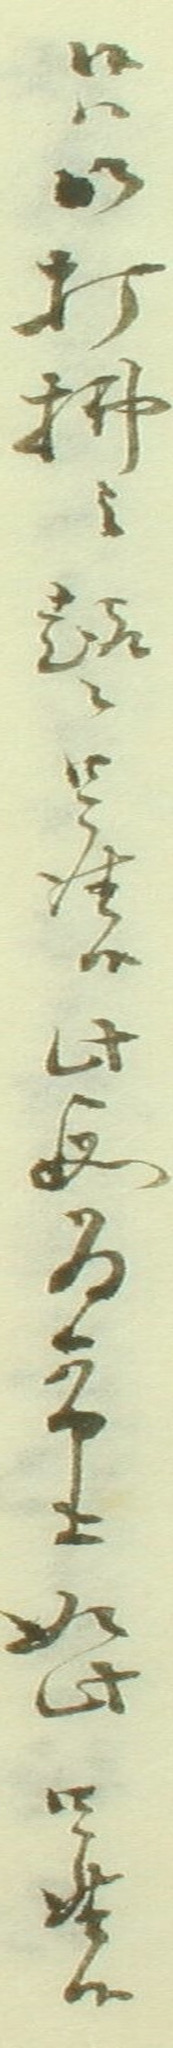候は御打払之趣に御座候此段為可申上如此御座候
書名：異国船漂着記
